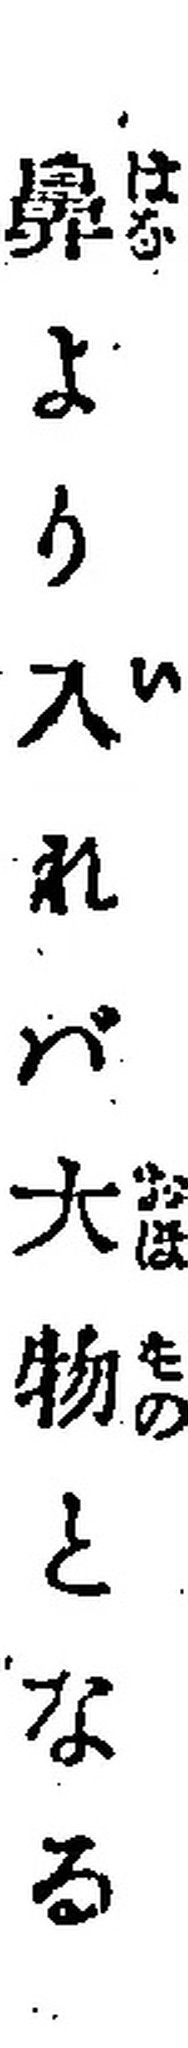鼻より入れば大物となる
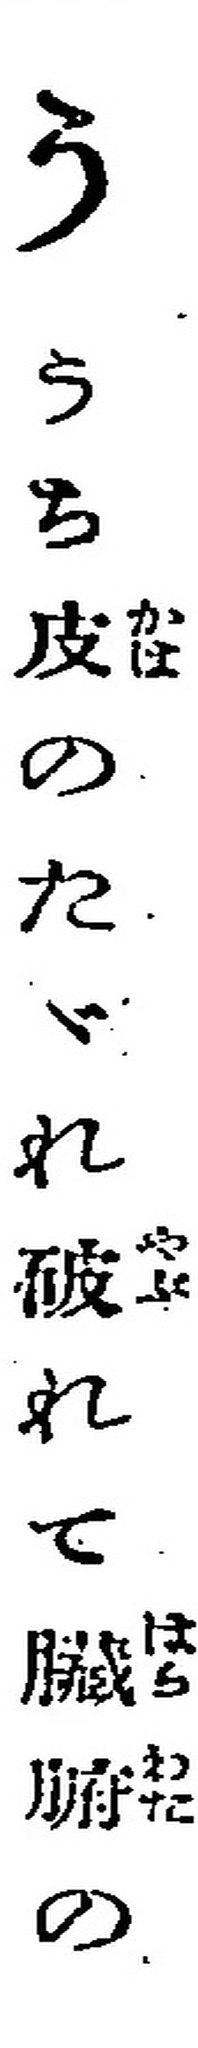ううち皮のたゞれ破れて臓腑の
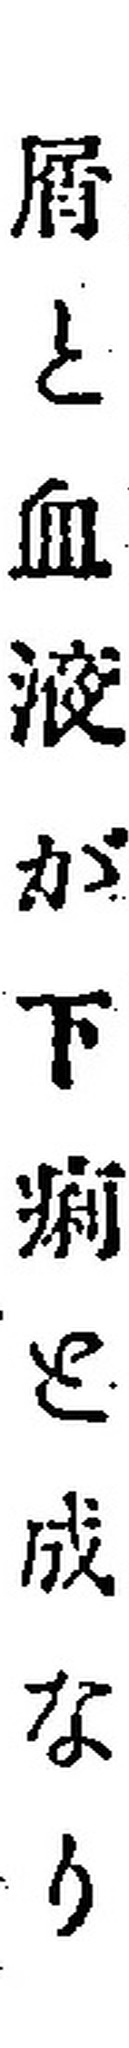屑と血液が下痢と成なり

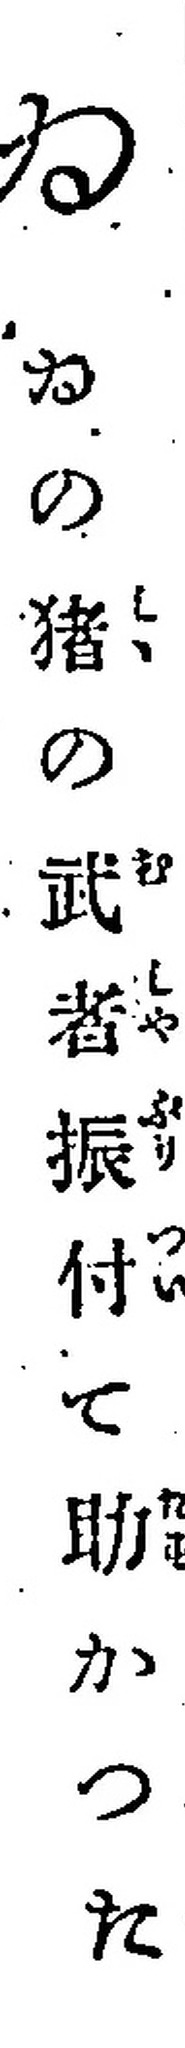ゐゐの猪の武者振付て助かつた
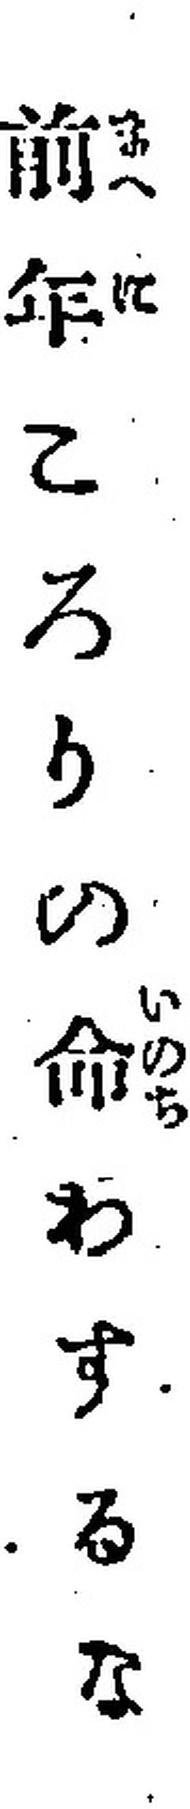前年ころりの命わするな
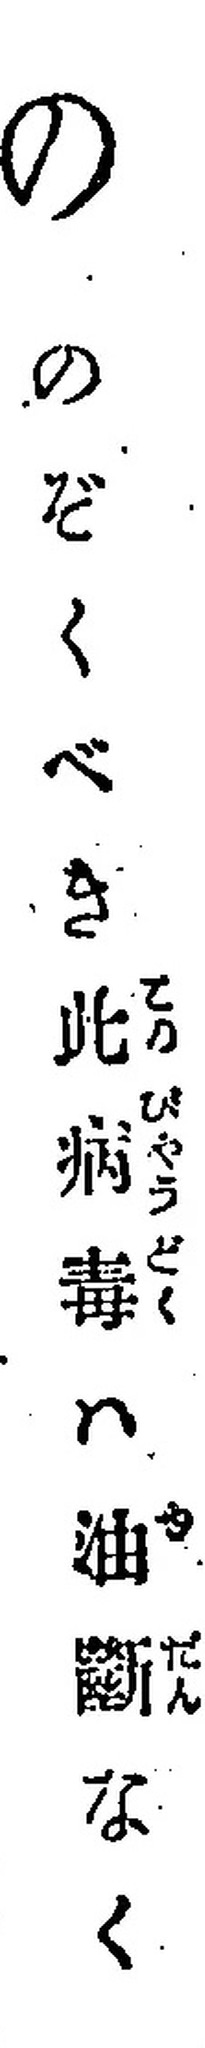ののぞくべき此病毒は油断なく
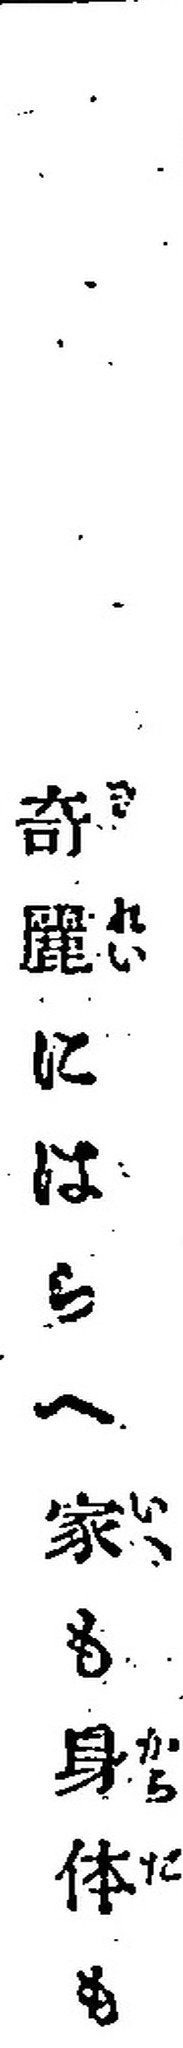奇麗にはらへ家も身体も
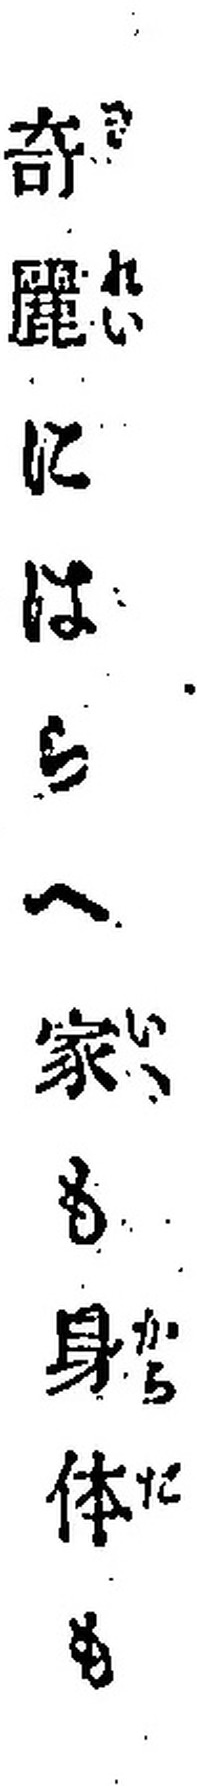奇麗にはらへ家も身体も
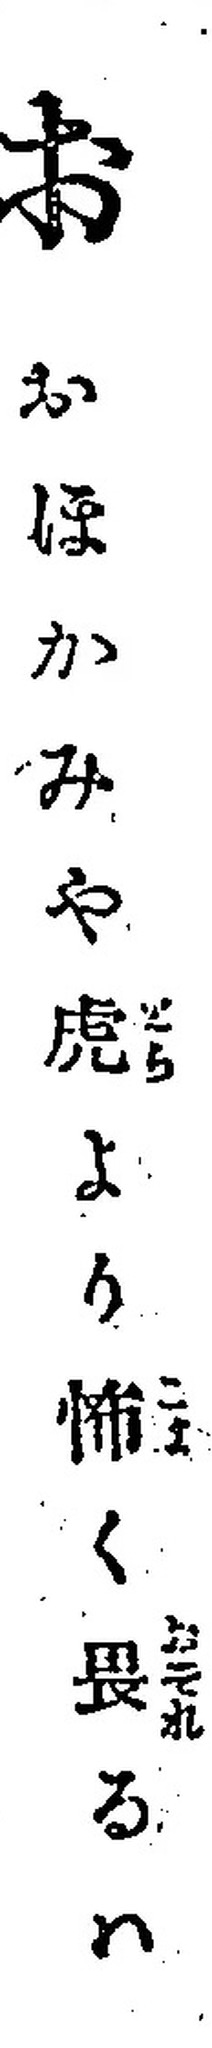おおほかいや虎より怖く畏るは
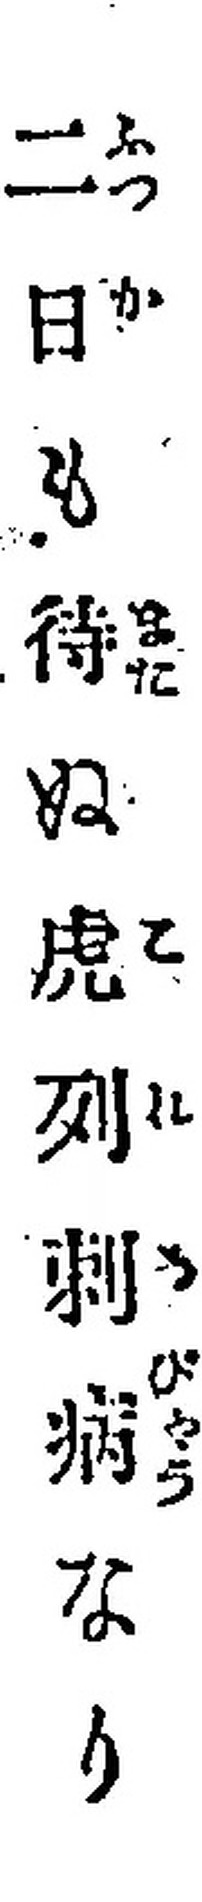二日も待ぬ虎列刺病なり
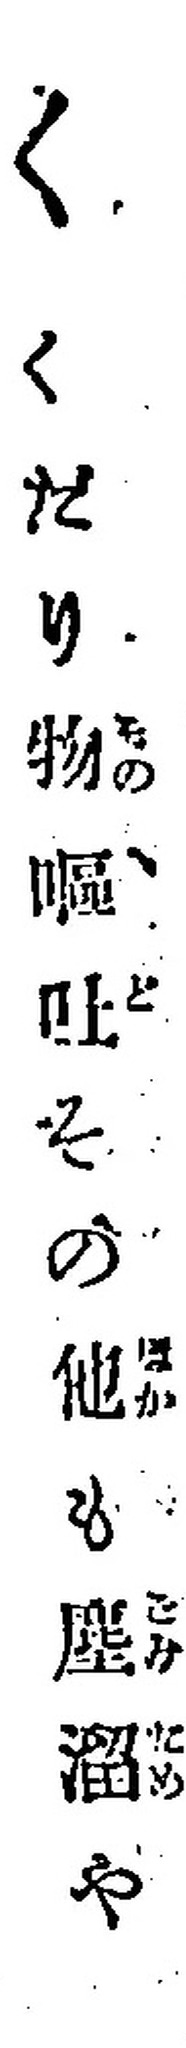くくだり物嘔吐その他も塵溜や
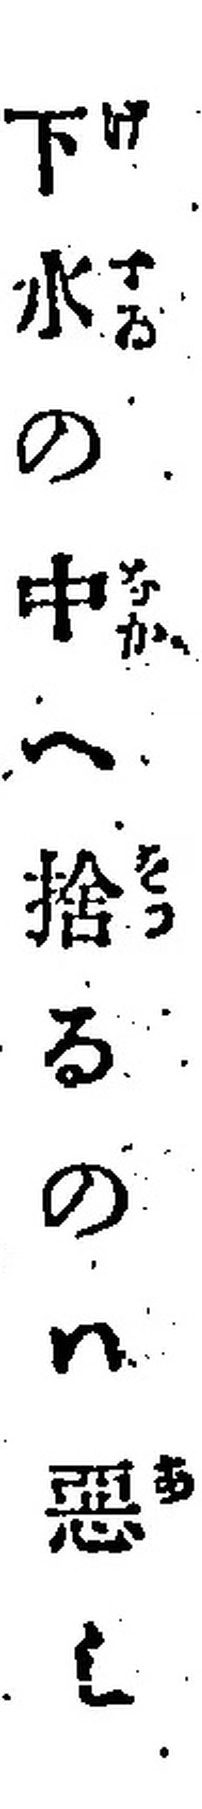下水の中へ捨るのは惡し
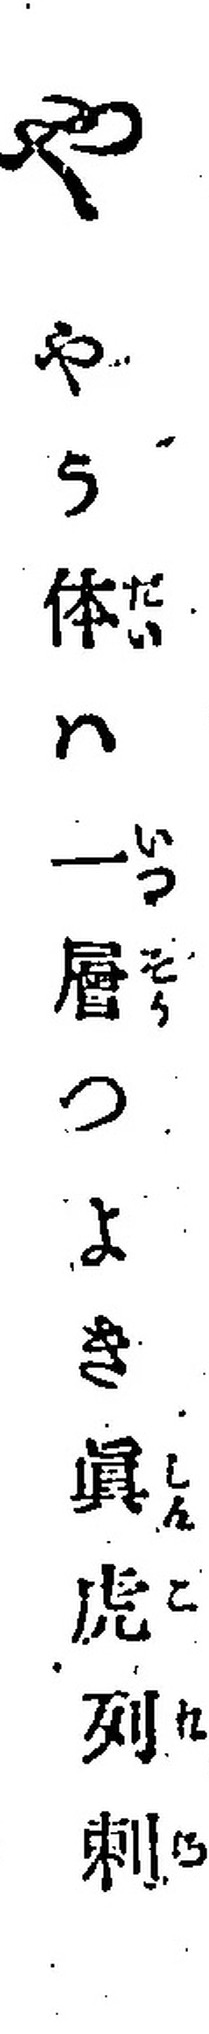ややう体は一層つよき眞虎列刺
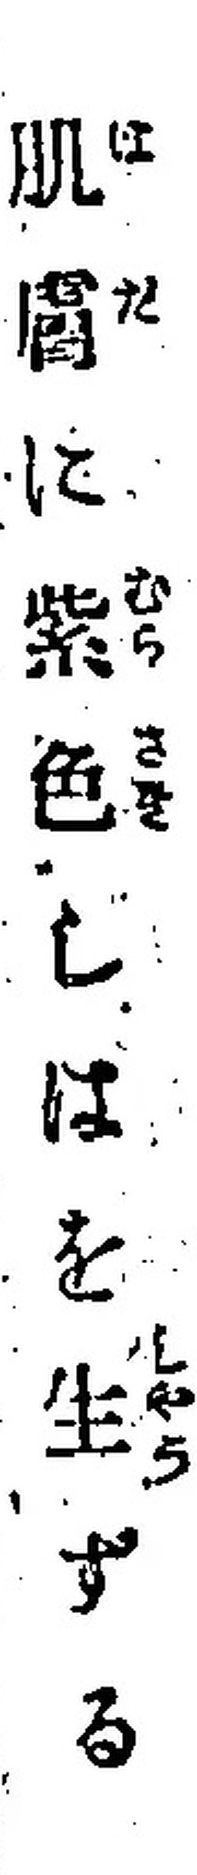肌膚に紫色しはを生ずる
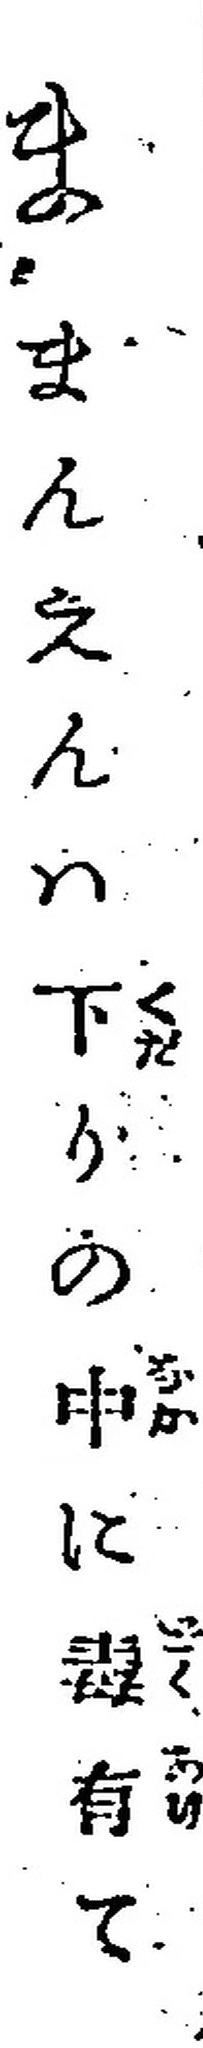ままんえんは下りの中に毒有て
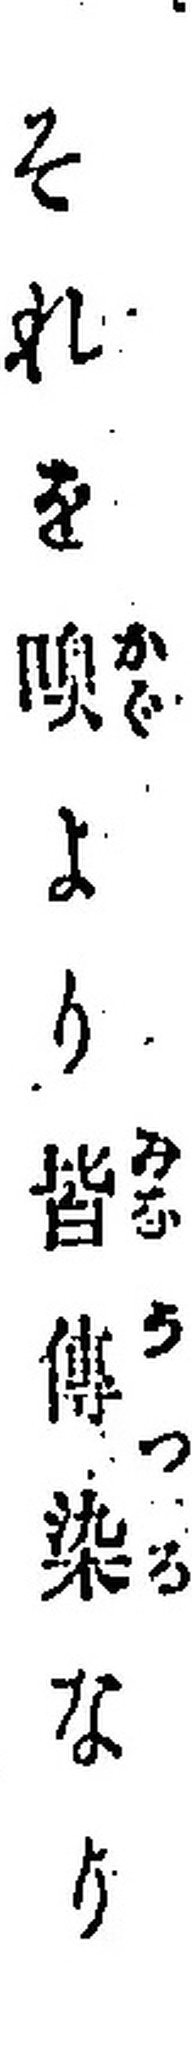それを嗅より皆傳染なり
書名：新撰暑中養生法 : 附・コレラ予防歌
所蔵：国立国会図書館 National Diet Library, JAPAN
